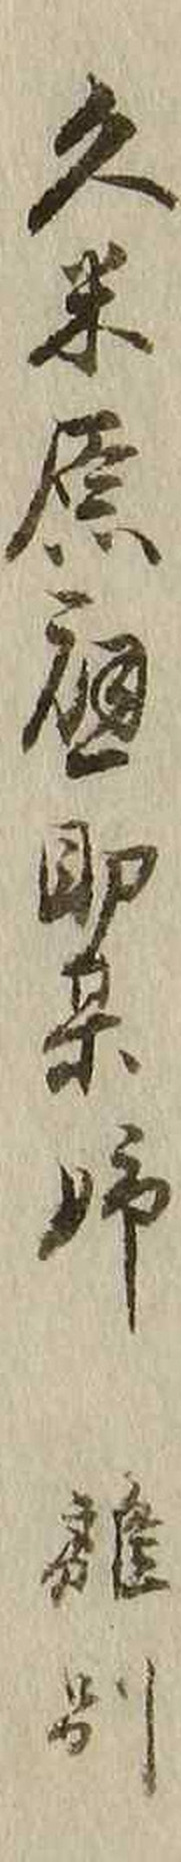久米原応助某姉離別
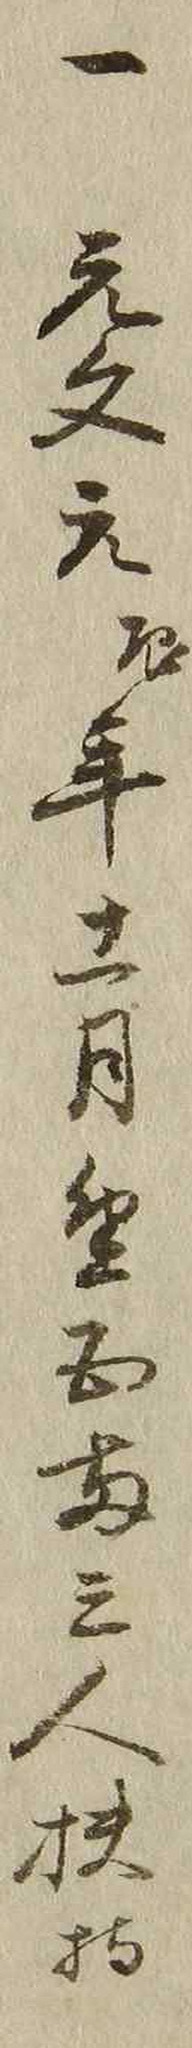一元文元辰年十一月金五両三人扶持
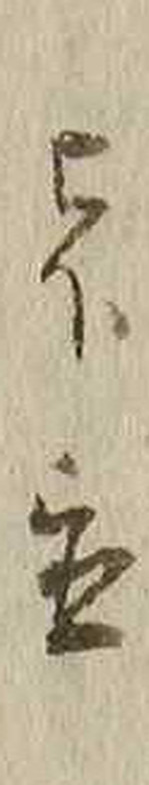被下置
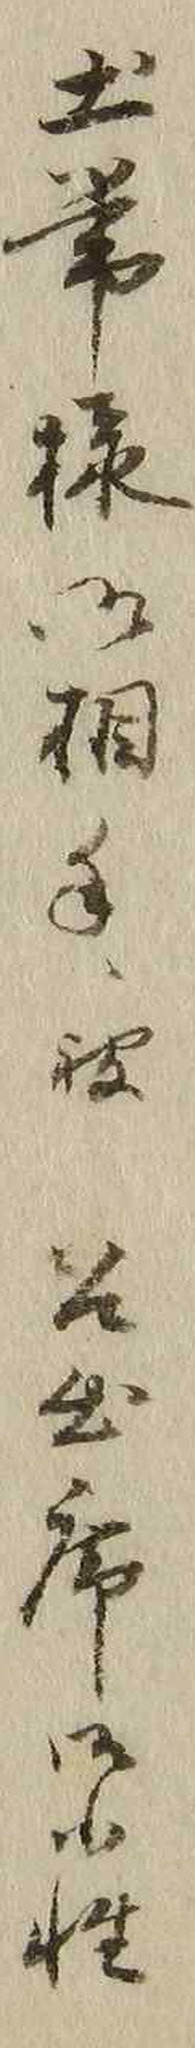土常様御相手ニ被召出席御小性
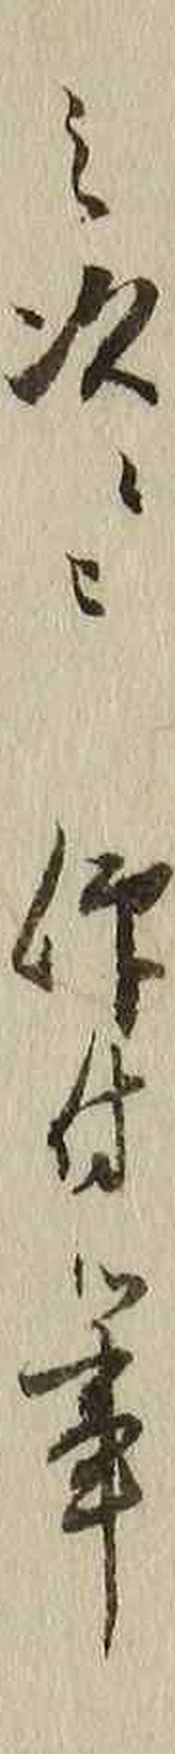之次ニ被仰付候事
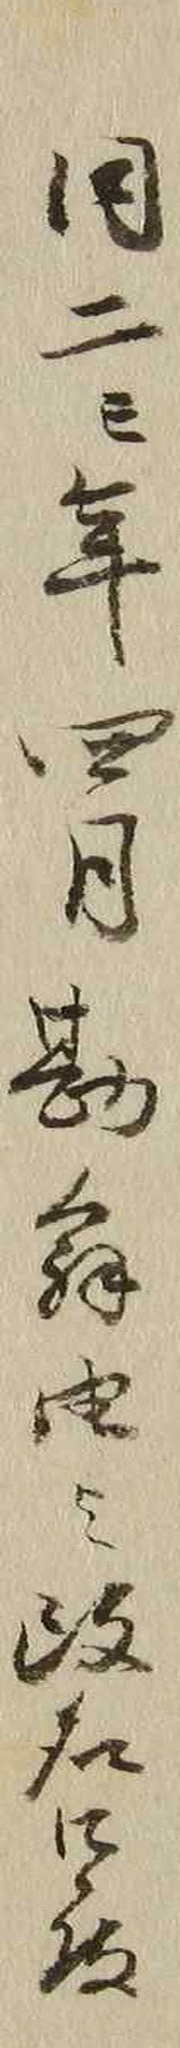一同二巳年四月勘解由与改名仕度
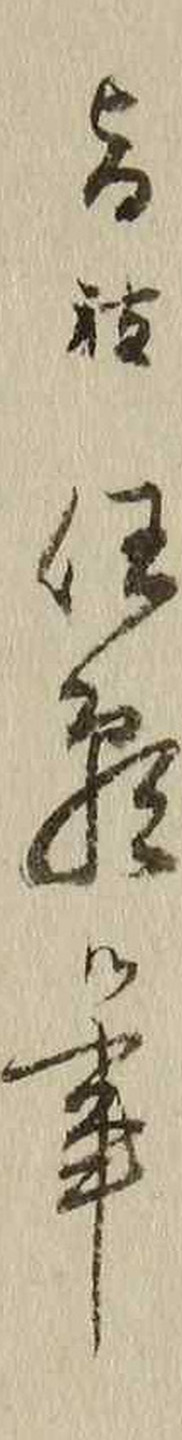旨被任願候事
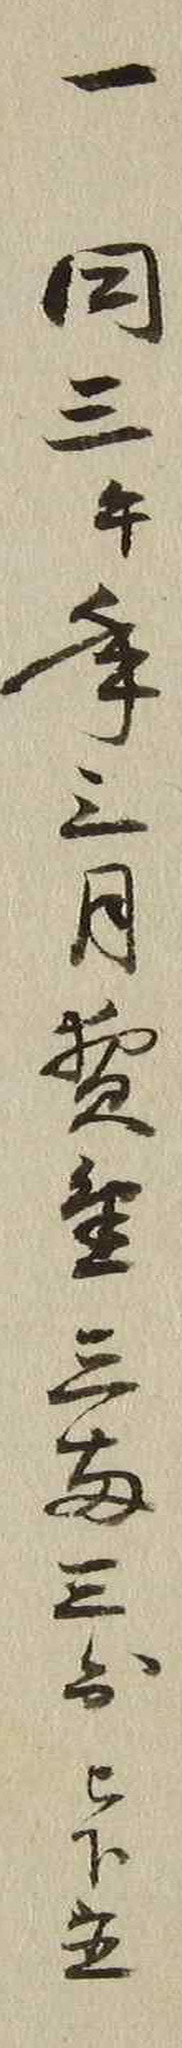一同三午年三月費金三両三分被下置
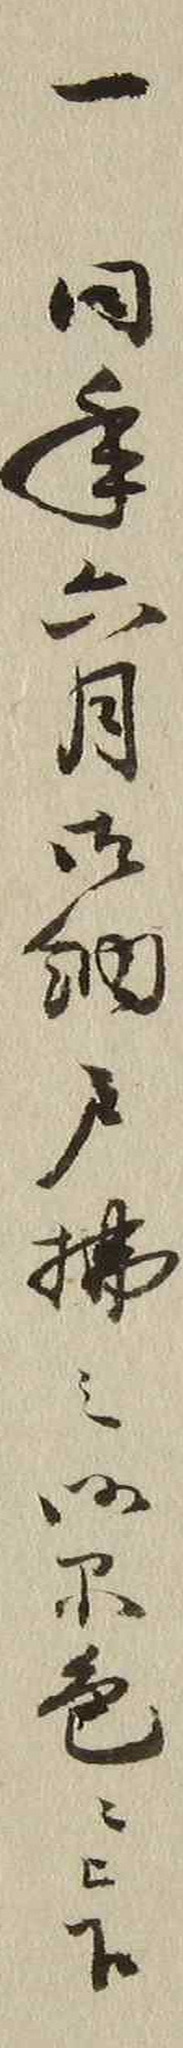一同年六月御納戸払之御品色ニ被下
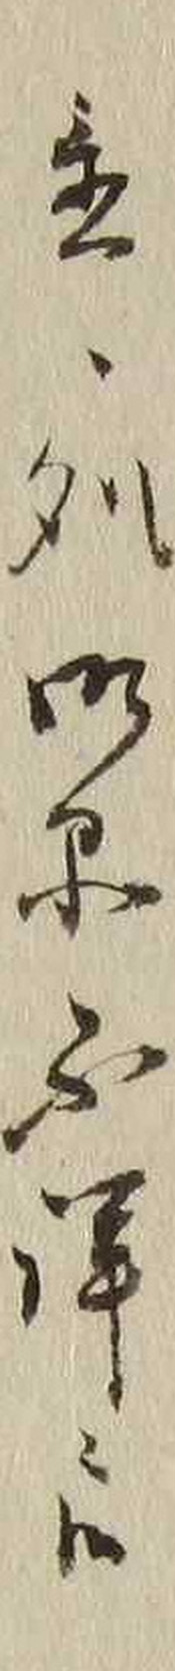置候処御品不詳ニ候
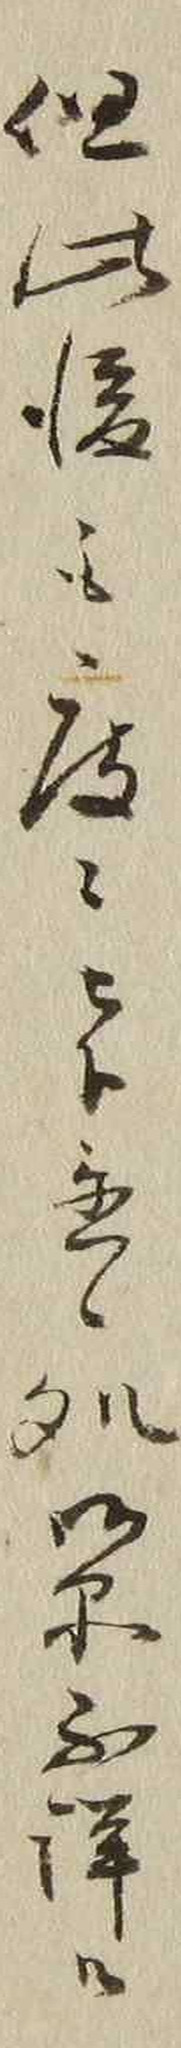但此後も度々被下置候処御品不詳候
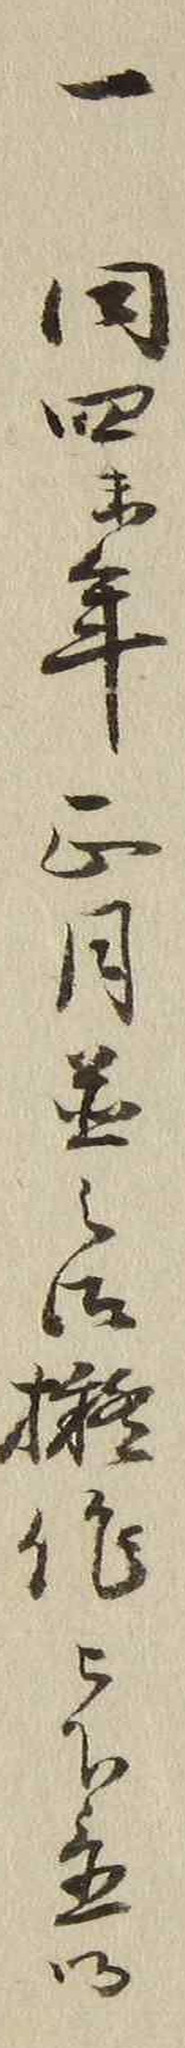一同四未年正月並之御擬作被下置御
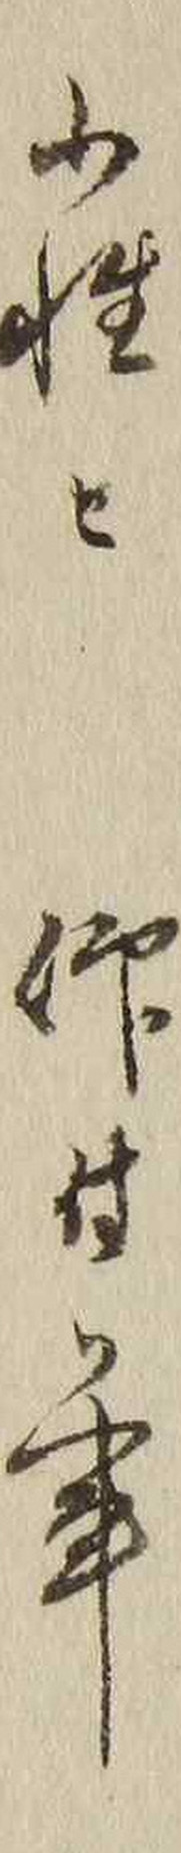小性被仰付候事
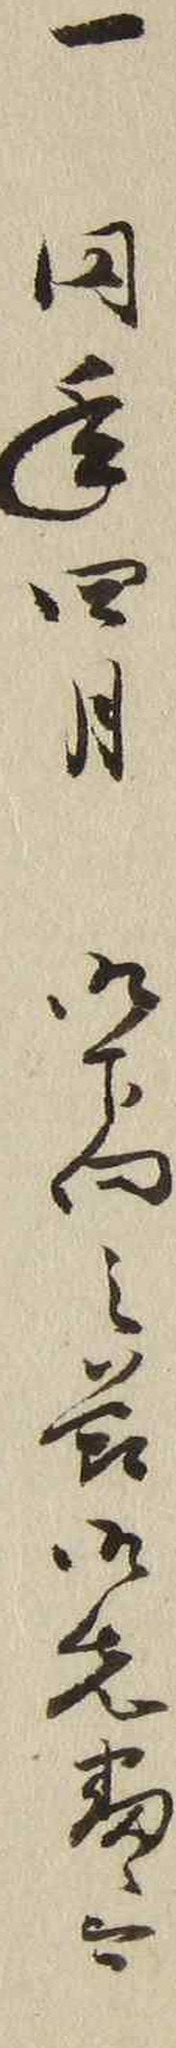一同年四月御下向之節御先番ニ而
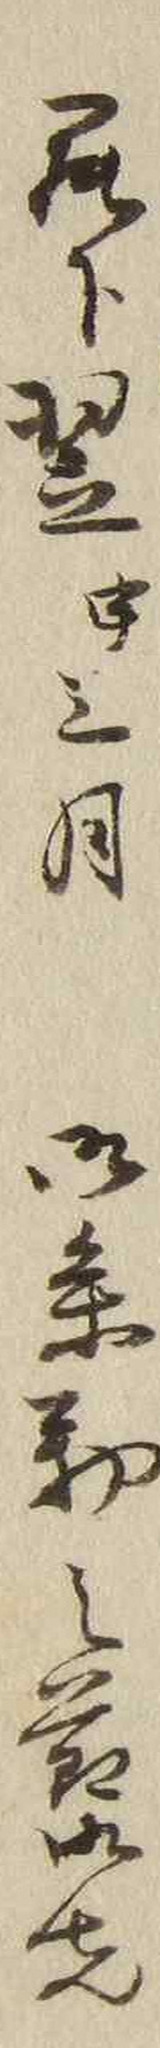罷下翌申三月御参勤之節御先

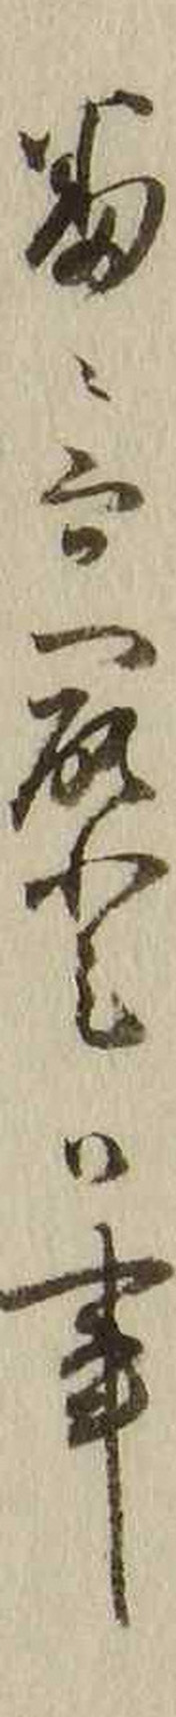番ニ而罷登候事
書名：諸士系譜　巻之225　ま之部6
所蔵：会津若松市立会津図書館
